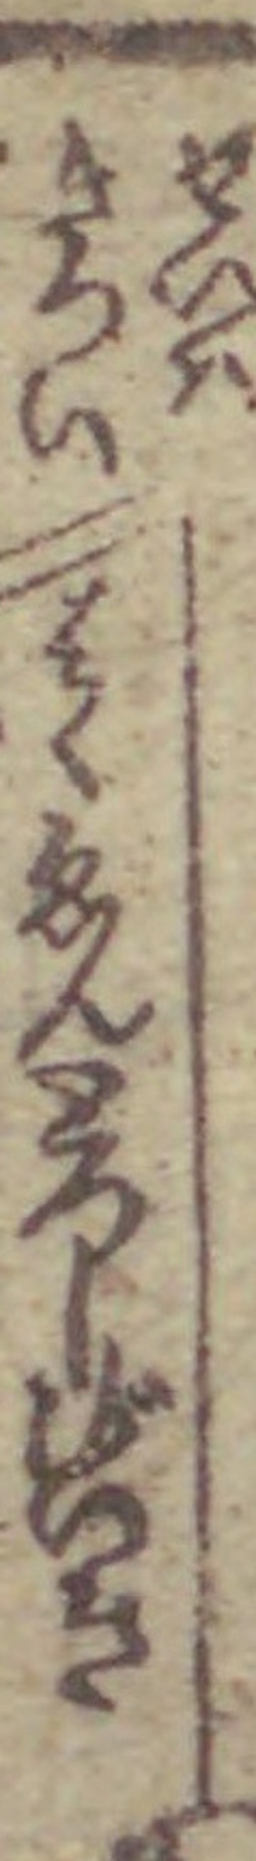きついはくゑんとつしびいき
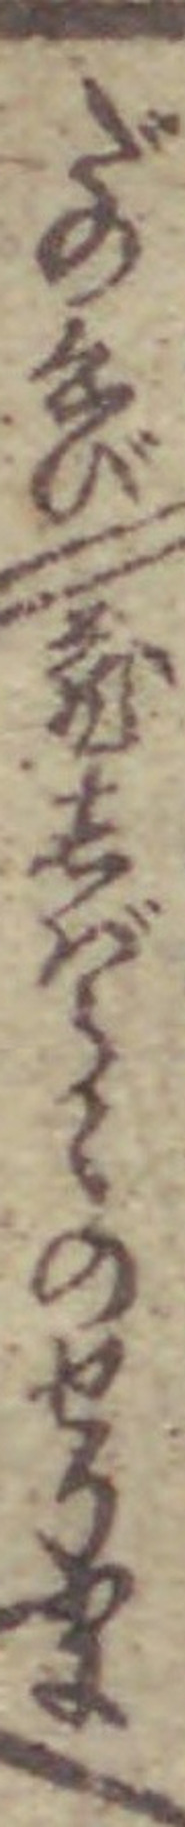だのゑび蔵しばらくのせりふに
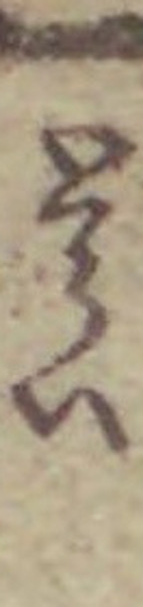とうい
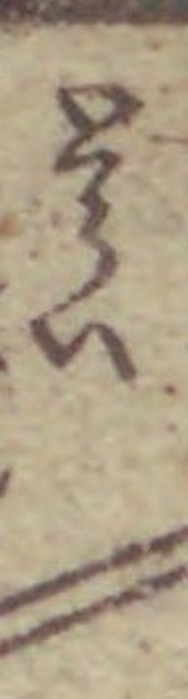とうい
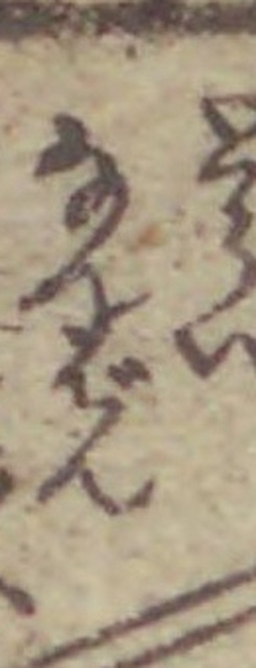なんばん
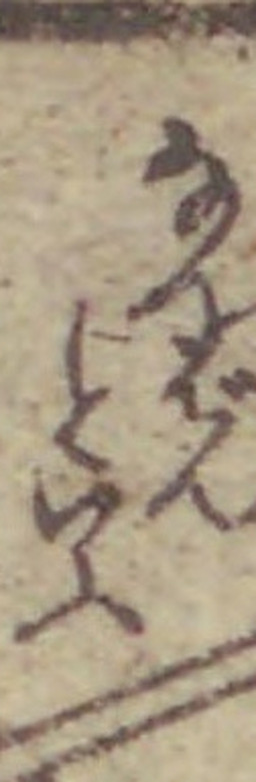といふ

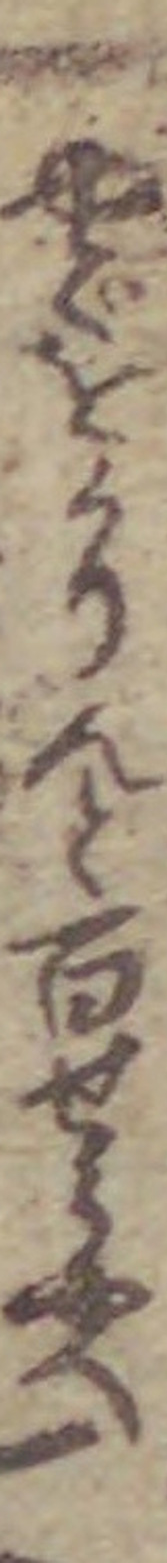やどをかりんと百せうやへ
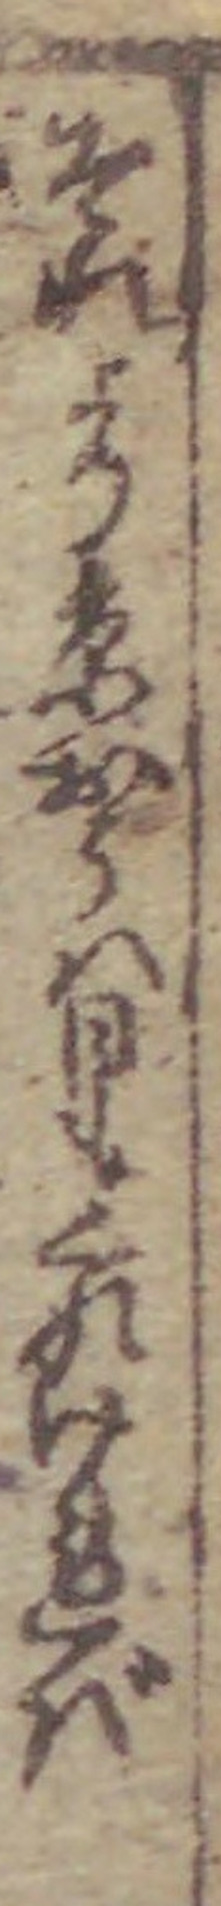それより京おうは日もくれければ
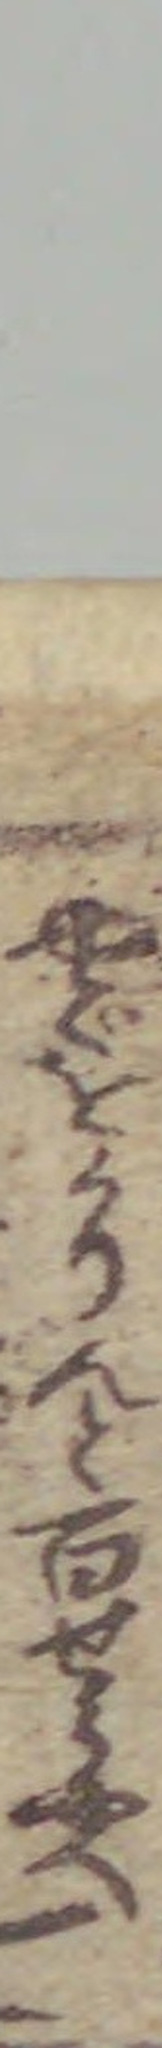やどをかりんと百せうやへ
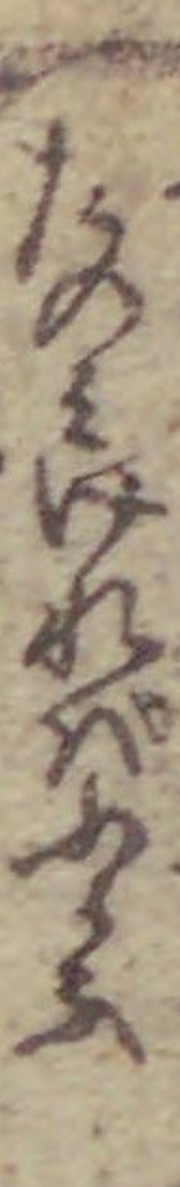たのみければふうふ
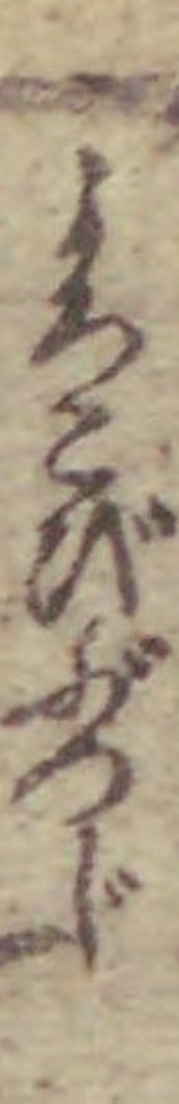よろこびぶつじ
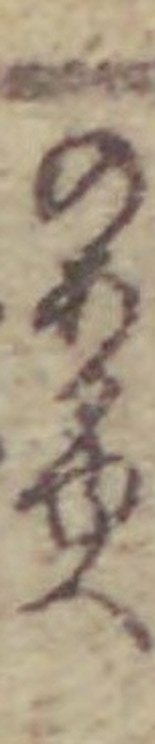のあるゆへ
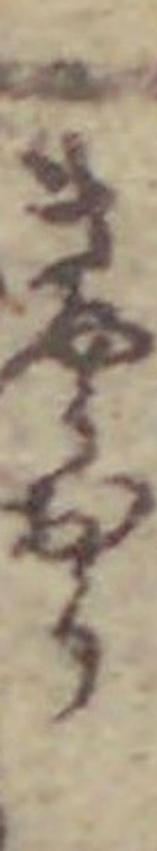きやうおう
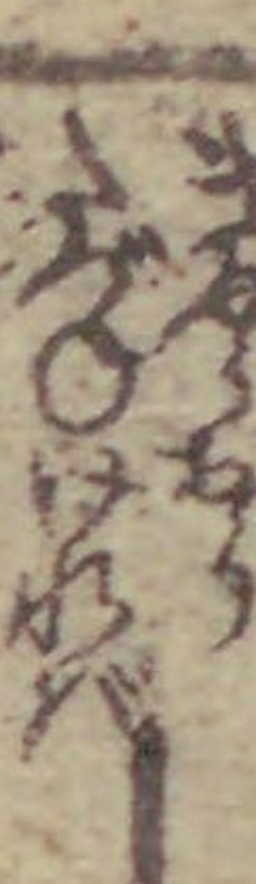たづねければ
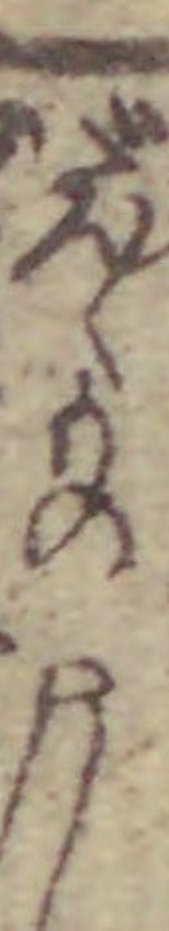だん〳〵もの
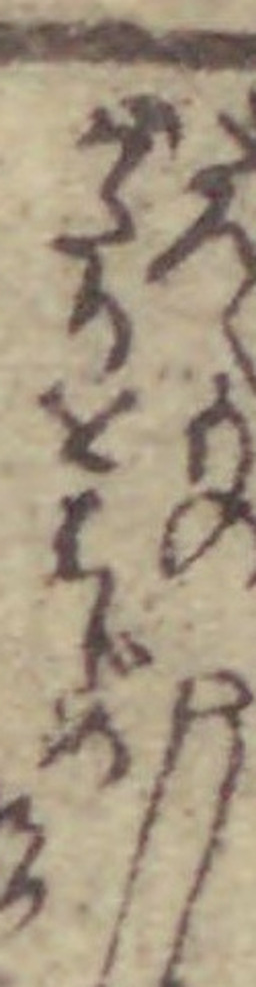がたりをはじめけり
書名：大通其面影 2巻
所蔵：国立国会図書館 National Diet Library, JAPAN
